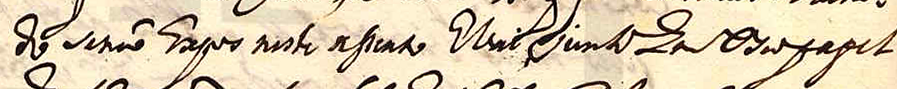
do senaõ Expos neste assento E vai junto Em o seo papel
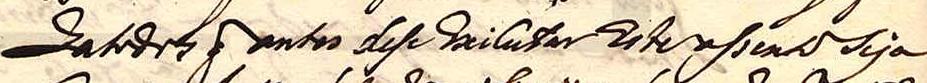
E a todos q̄ antes de se ExiCutar Este assento seja
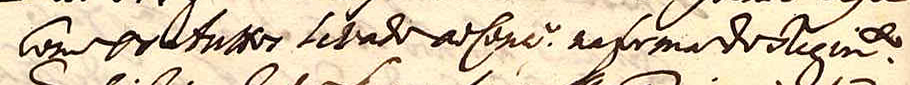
Com os Auttos levado ao Conc.o na forma do Regim.to
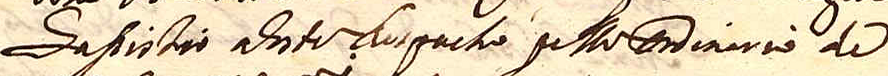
E assistio a Este despacho pello ordinario de
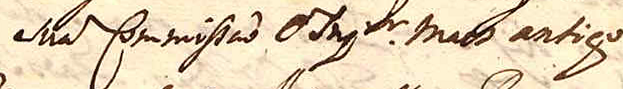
sua Commissaõ o Inq.or mais antigo
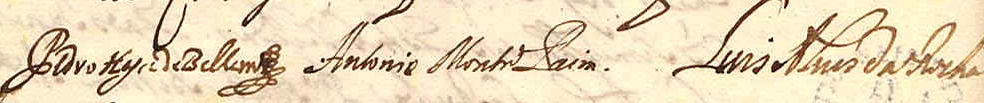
Pedro Hasse de Bellem Antonio Montro Paim. Luis Alues da Rocha
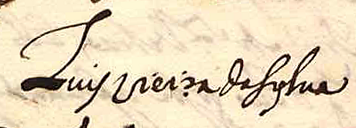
Luis vieira da sylua
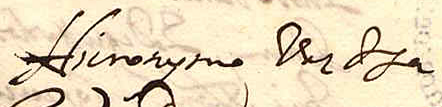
Hieronymo Vaz d̄ Sa
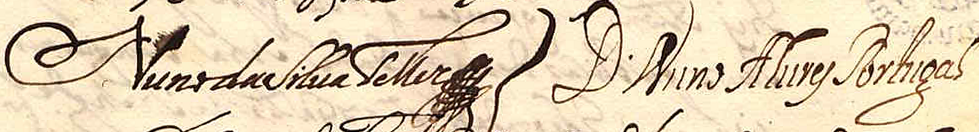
Nuno da Silua Tellez D. Nuno Alures Portugal
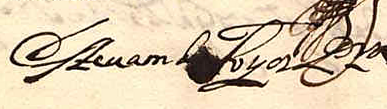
Esteuam d_ Foyo P.ra
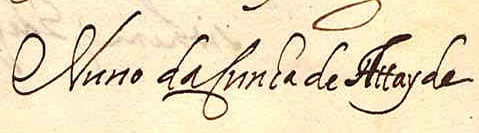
Nuno da Cunha de Attayde
